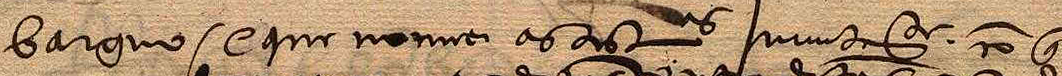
barguo / e que nomee as testas Jumtamte c̄o q̄
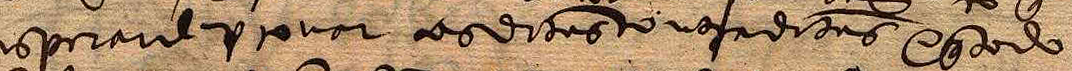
esperar de prouar as ditas contraditas e q̄ todo
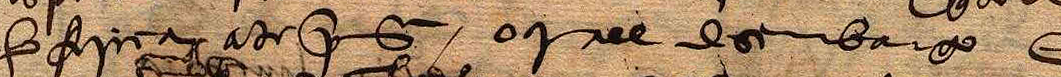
hofereça ate p̄ma / o quall desembargo e
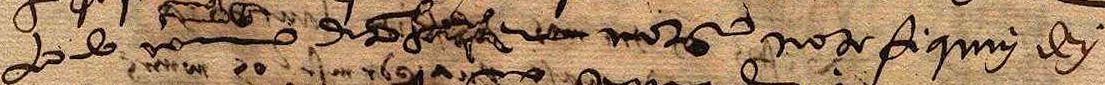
todo como dito he eu notro notefiquey dey
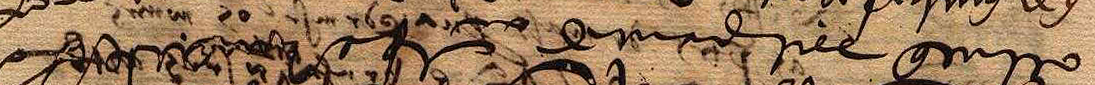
e ētreguey a frco de madrill genrro
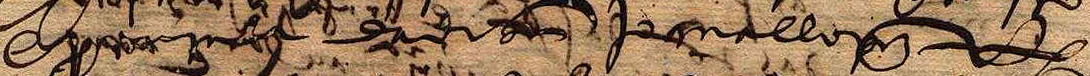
e ꝓcurador da dita Joana llopez Rꝭ
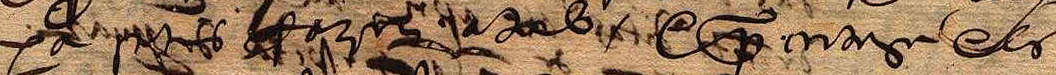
ꝑa satisfazer a todo / e p̄o certeza e lē
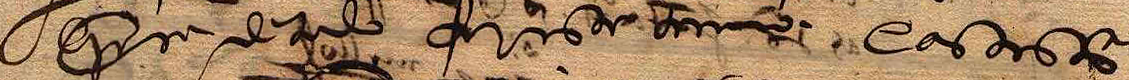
brāça de tudo fiz este termo e as testas
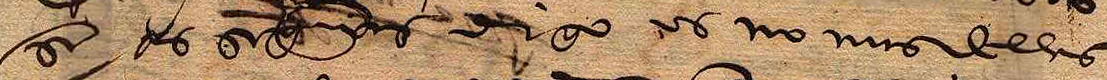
sā as seguj̄tes digo os nomes dellas
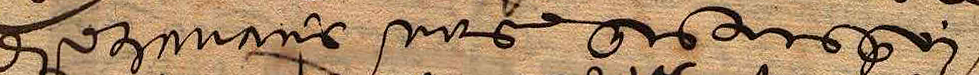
djo trauaços notro q̄ esto esp̄vj
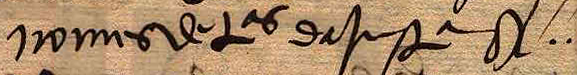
nomes de tas da Justa A.
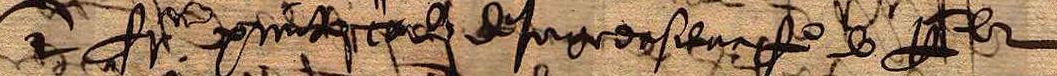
item frco pimto ciado de Jorge da silua fo do Rdor
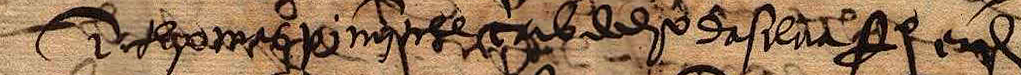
item thomas pim̄jtell ciado de djo da silua fo eid̄
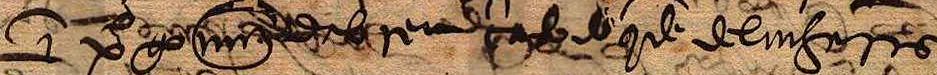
item po gomez dabreu ciado do ꝯ̄de de linhares
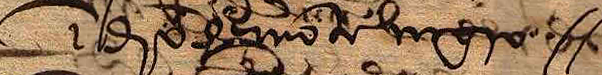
item djo de mōtenegro//
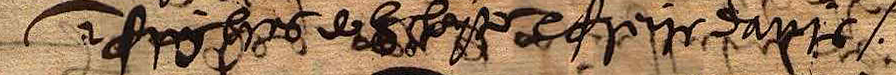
item frey bras do habyto e freire dauis /.
